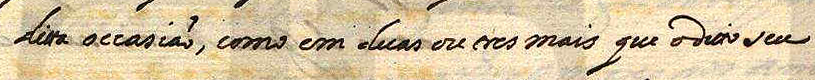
ditta occasiaõ, como em duas ou tres mais que o ditto seu
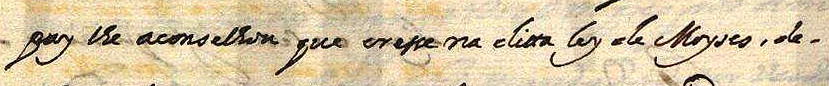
pay lhe aconselhou que cresse na ditta ley de Moyses, de
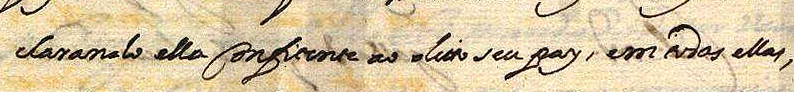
clarando ella Confitente ao ditto seu pay, em todas ellas,
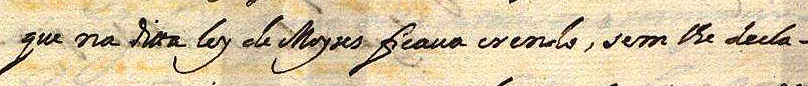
que na ditta ley de Moyses ficaua crendo, sem lhe decla
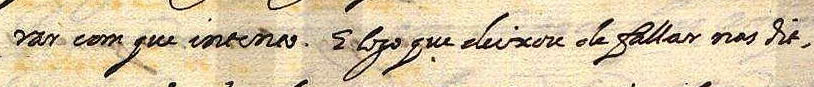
rar com que intento. E logo que deixou de fallar nas dit
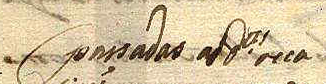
passadas as d.as occa
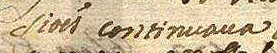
sioẽs continuaua
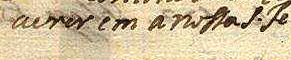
a crer em a nossa s.ta Fe
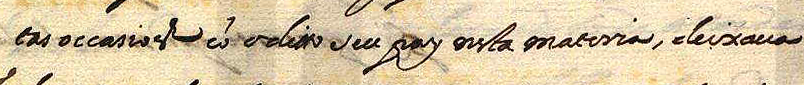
tas occasioẽs cō o ditto seu pay nesta materia, deixaua
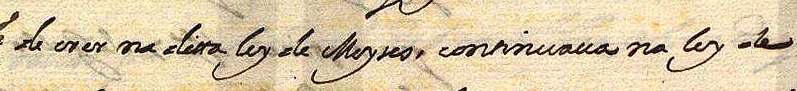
de crer na ditta ley de Moyses, continuaua na ley de
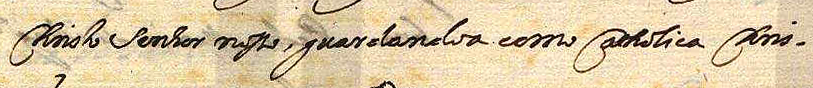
Christo Senhor nosso, guardandoa como Catholica Chris
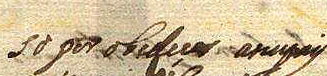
so por obedecer a seu pay
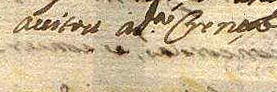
aceitou a d.a Crença
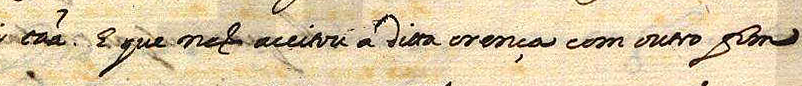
taā. E que naõ aceitou a ditta crença com outro fim
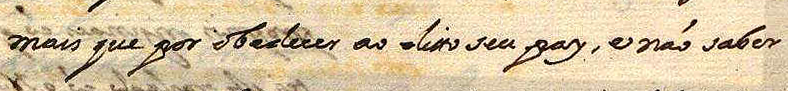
mais que por obedecer ao ditto seu pay, e não saber
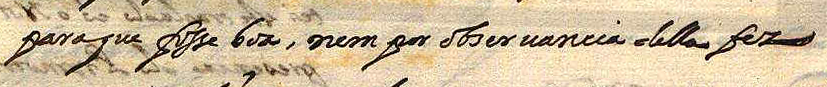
para que fosse boa, nem por obseruancia della fez
